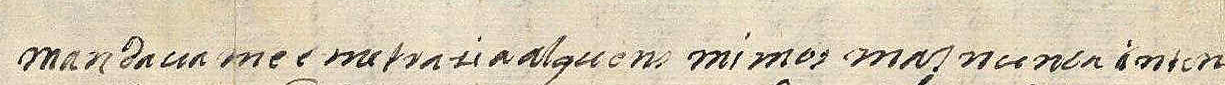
mandauame e metrazia alguens mimos mas nunca inten
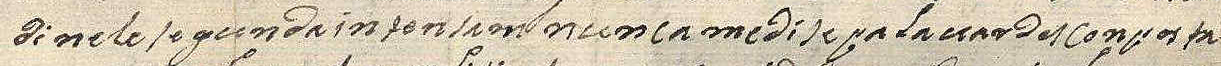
di nele segunda intensam nunca me dise palauar desconposta
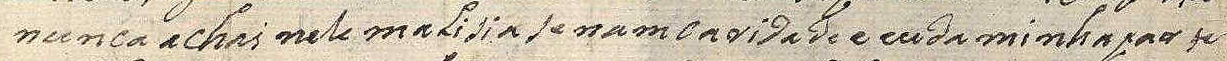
nunca achai nele malisia senam caridade e eu da minha parte
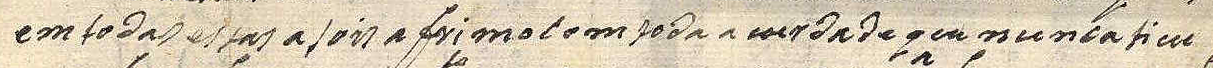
em todas estas asois afrimo com toda a uerdade que nunca tiue
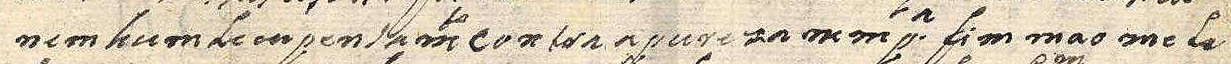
nemhum le ou pensamto contra a pureza nem p.a fim mao me la
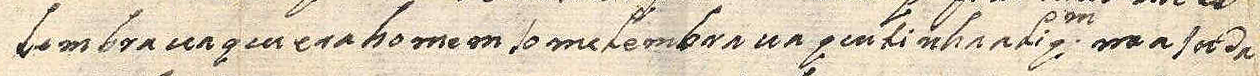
lembraua que era homem so me Lembraua que tinha ali q.m ma ajuda
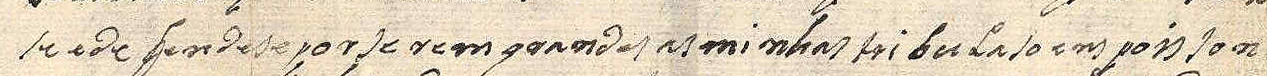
se e defendese por serem grandes as minhas tribulasoens pois so n
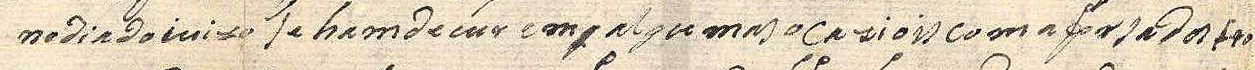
no dia do iuizo se ham de uer em q algumas ocaziois com a forsa dos tro
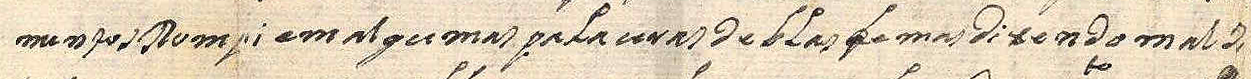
mentos Rumpi em algumas palauras de blasfemas dizendo maldi
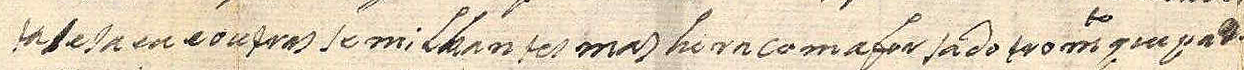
ta seja eu e outras semilhantes mas hera com a forsa do tromto que pa_
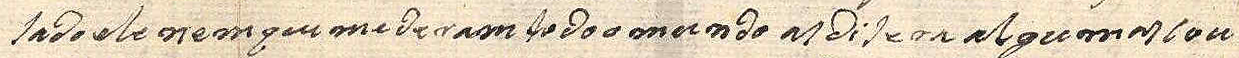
sado ele nem que me deram todo o mundo as disera algumas cou
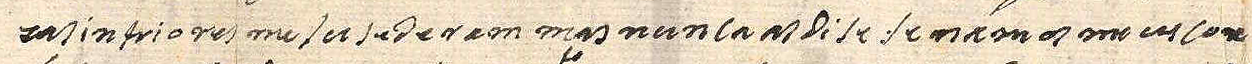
zas intriores me susederam mas nunca as dise senam os meus con
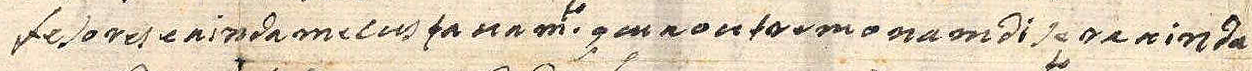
fesores e ainda me custaua m.to que a outrem o nam disera ainda
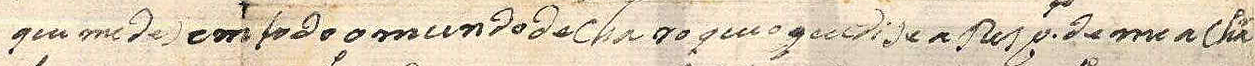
que me desem todo o mundo declaro que o que dise a Resp.to de me achar
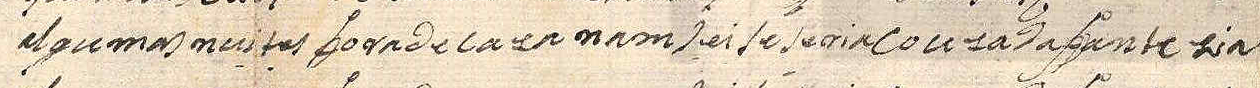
algumas nuites fora de caza nam sei se seria couza da fantezia
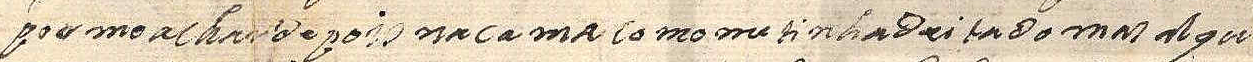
por me achar depois na cama como me tinha deitado mas algu
